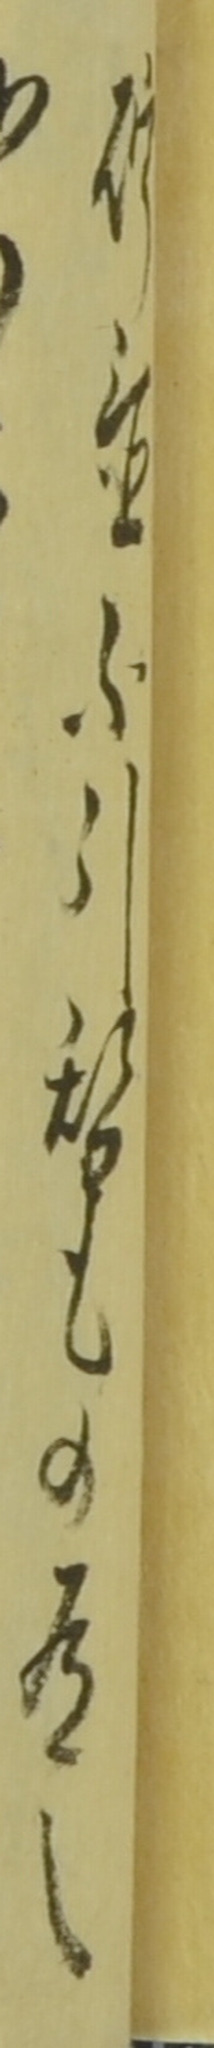貯置不引替もの有之
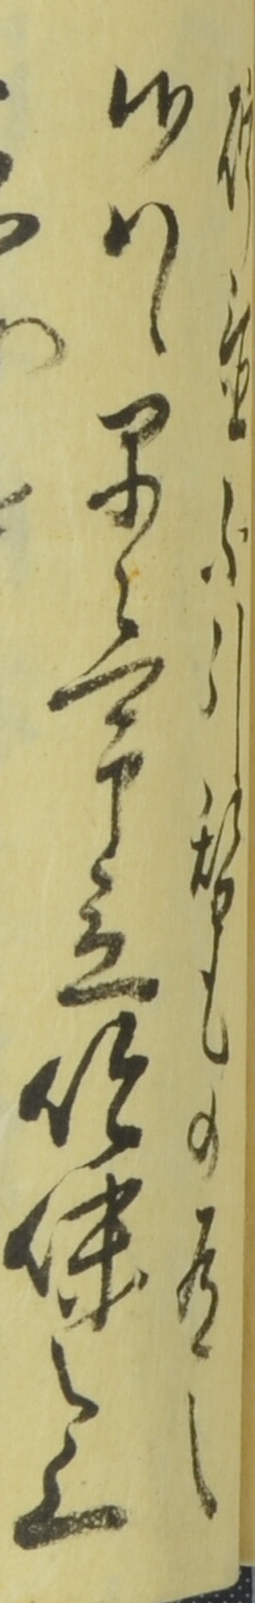候ハヽ早々可申立吟味之上
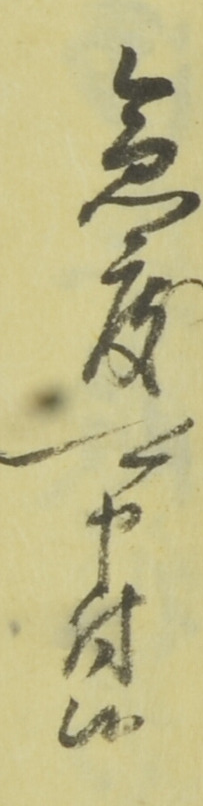急度可申付候

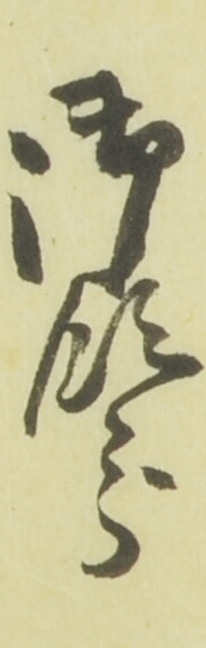御領分
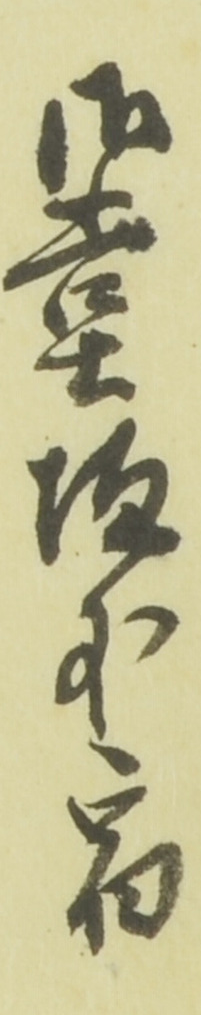御堂坂本宿
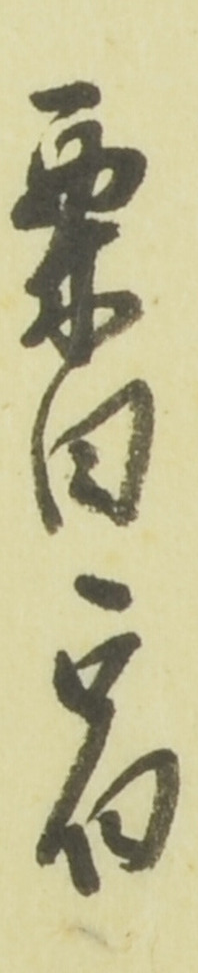栗田宿
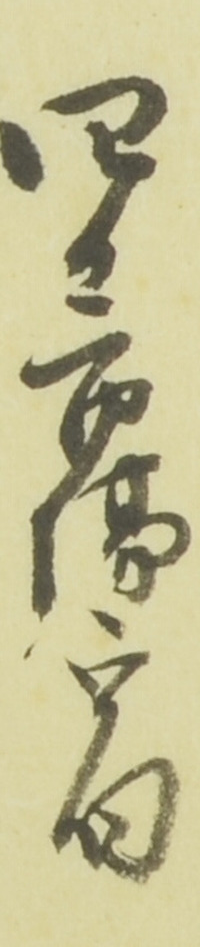四日市場宿
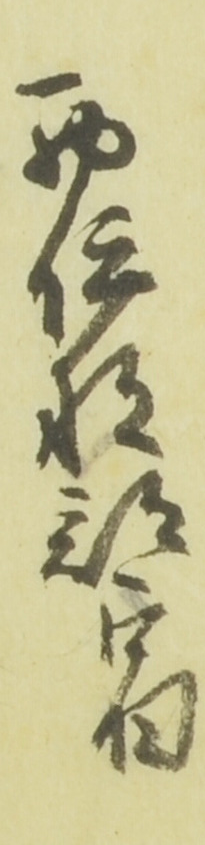西伊那郡宿
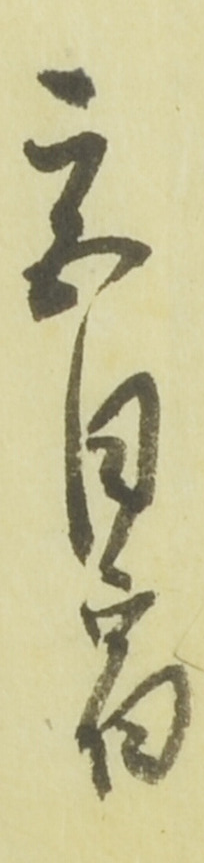宮田宿
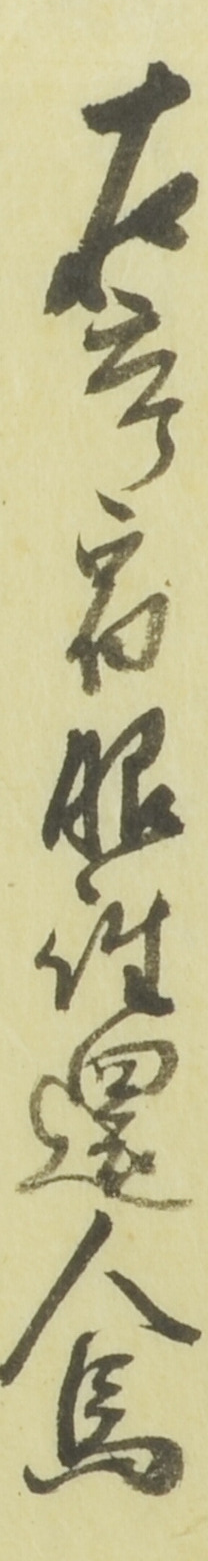右六ヶ宿脇往還人馬
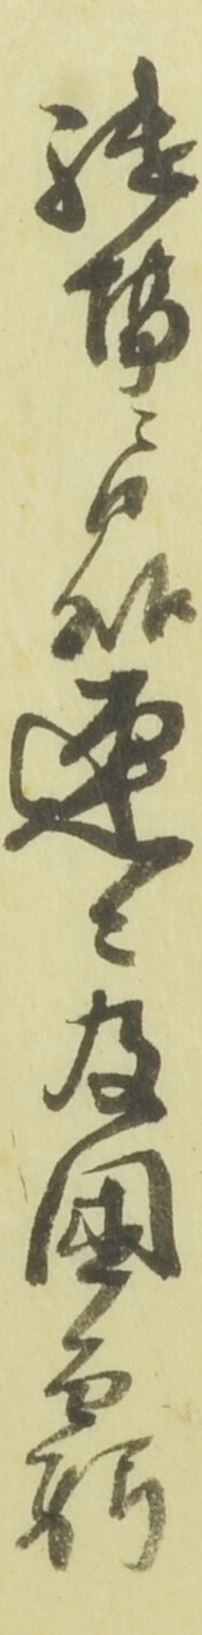継場ニ候処連々及困窮
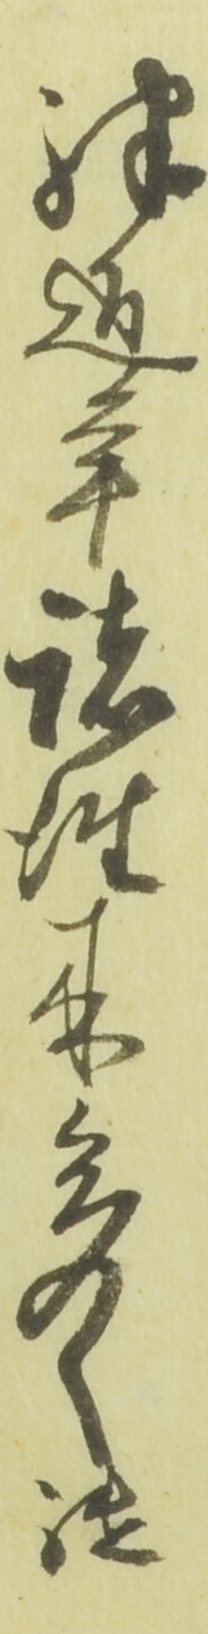殊近年諸往来多く継
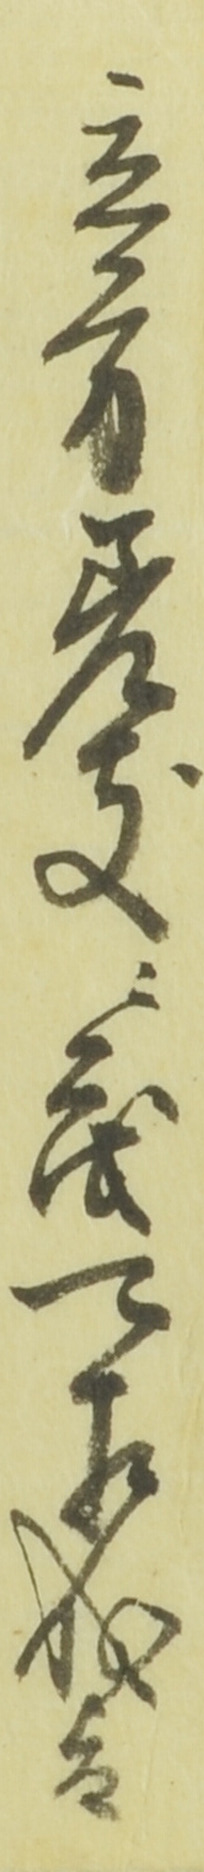立方差支ニも可相成旨
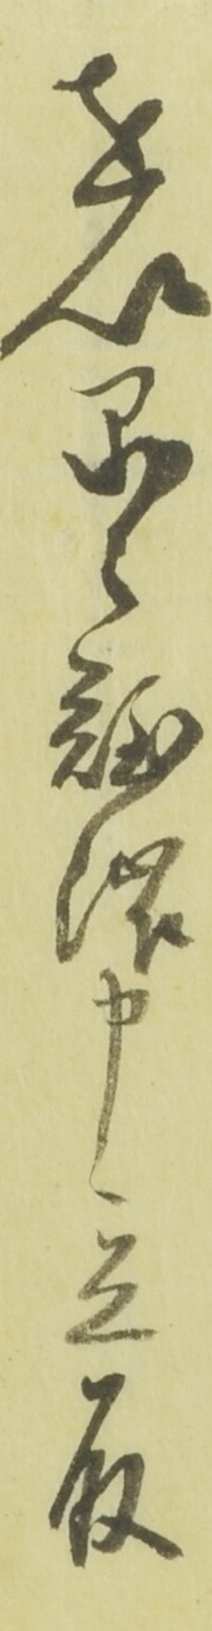を以品々難渋申立取
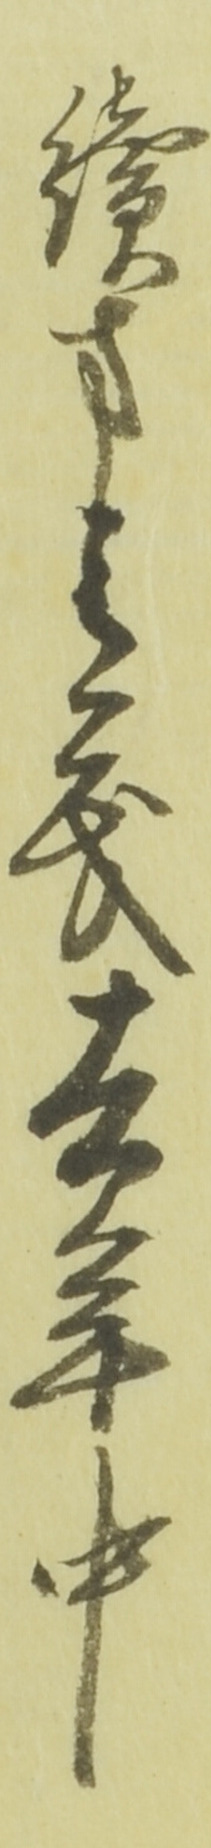続方之義去年中
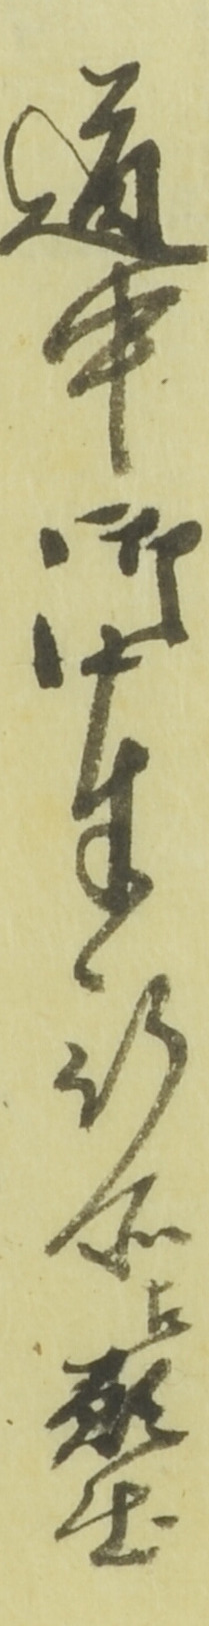道中御奉行所江願出
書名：御触書御書附控
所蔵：伊那市立高遠町図書館・合同会社AMANE
